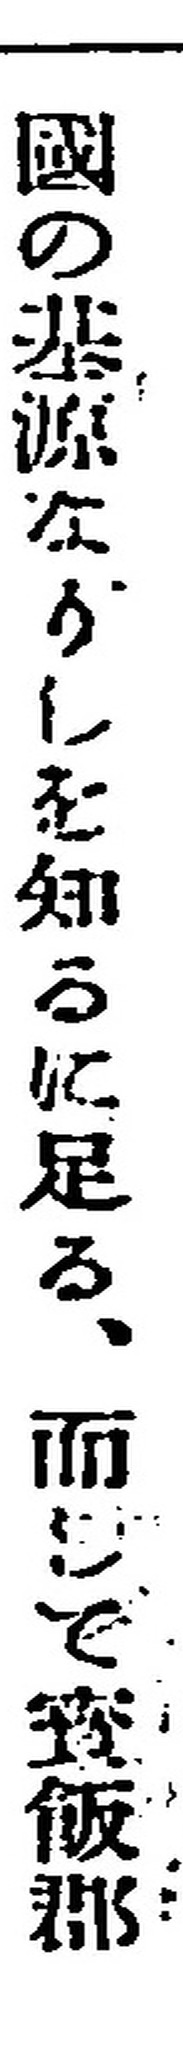国の基源なりしを知るに足る、而して宝飯郡
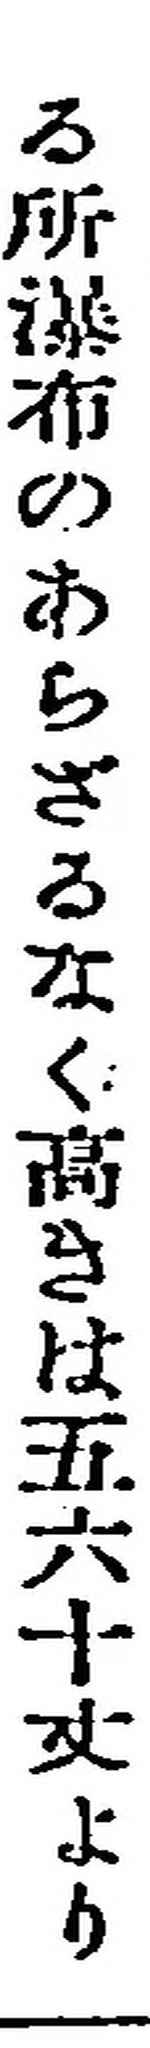る所瀑布のあらざるなく高きは五六十丈より
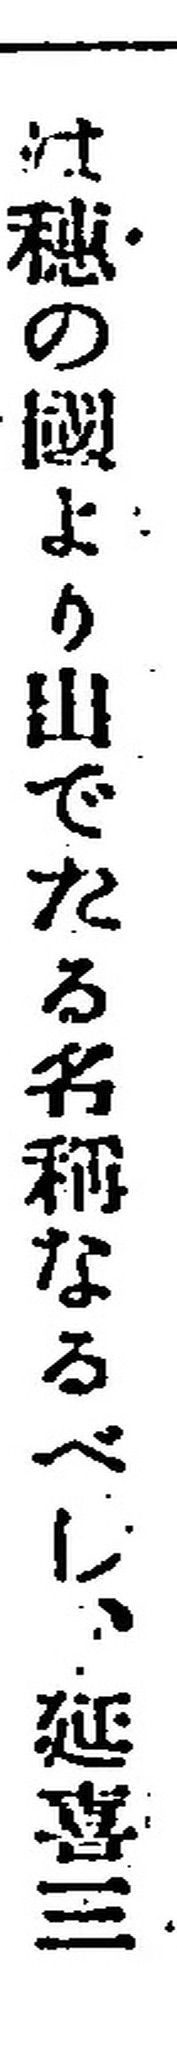は穂の国より出でたる名称なるべし、延喜三
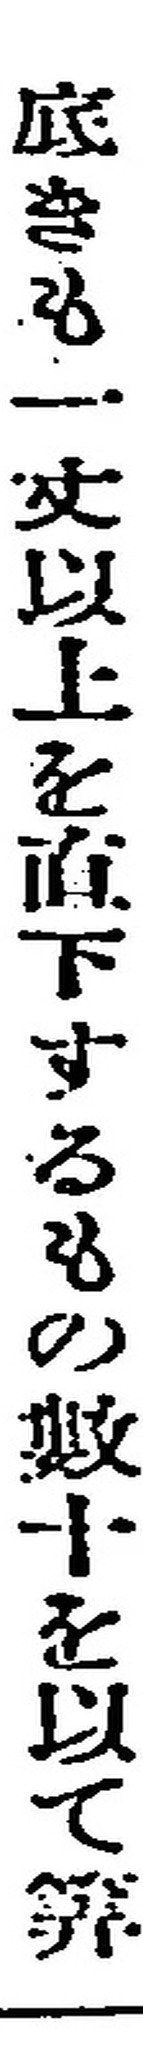底きも一丈以上を直下するもの数十を以て筭
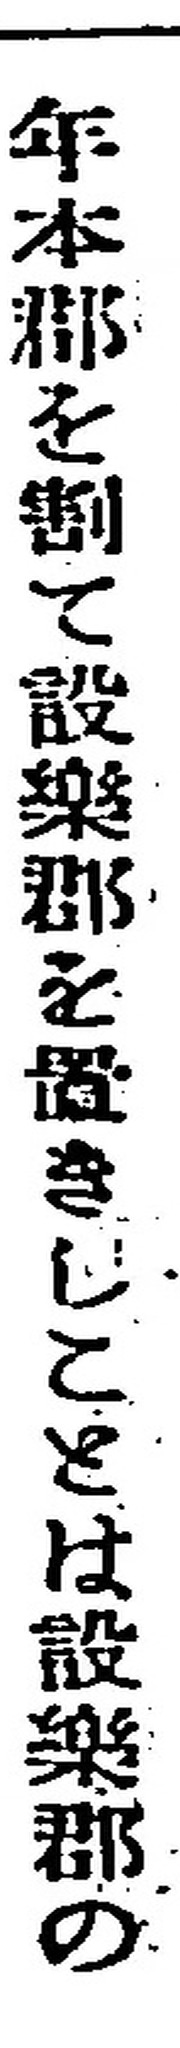年本郡を割て設楽郡を置きしことは設楽郡の
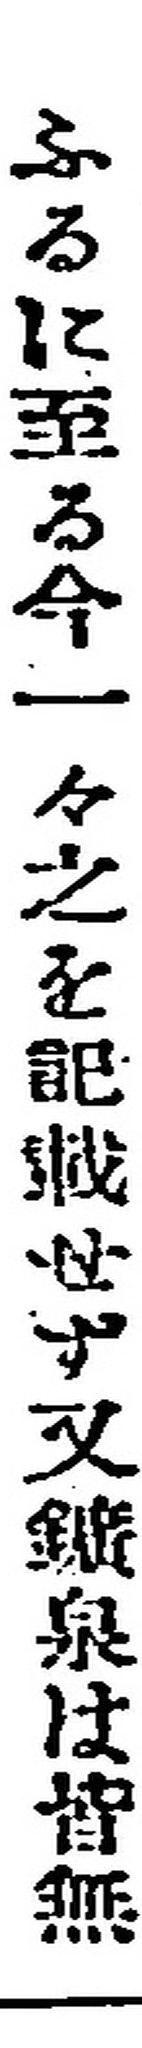ふるに至る今一々之を記載せず又鉱泉は皆無
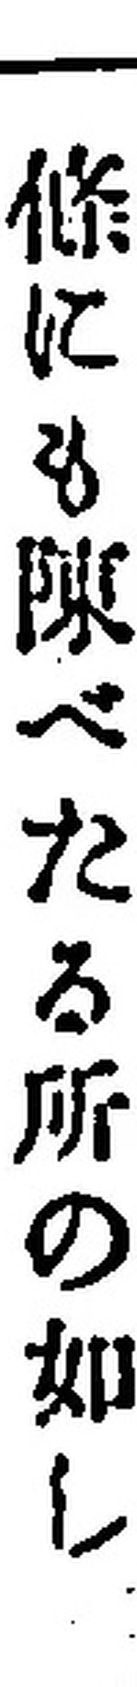条にも陳べたる所の如し
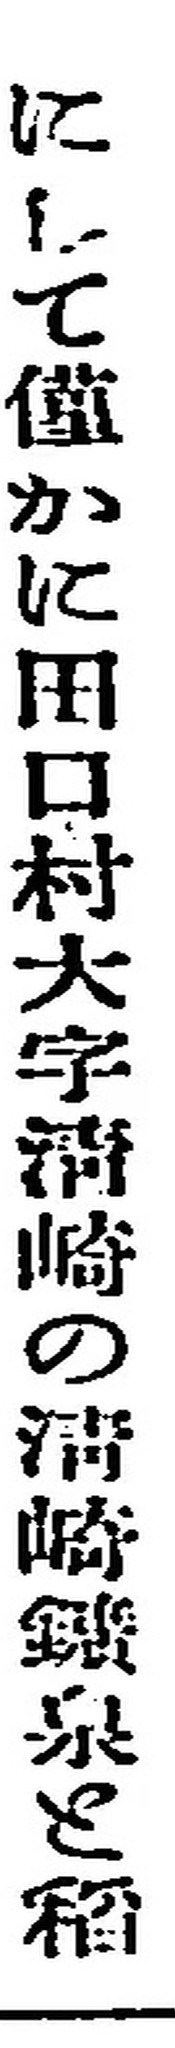にして僅かに田口村大字清崎の清崎鉱泉と稲
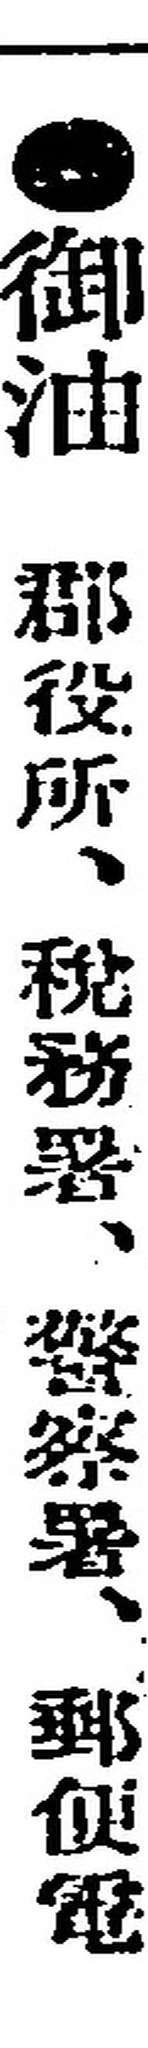●御油郡役所、税務署、警察署、郵便電
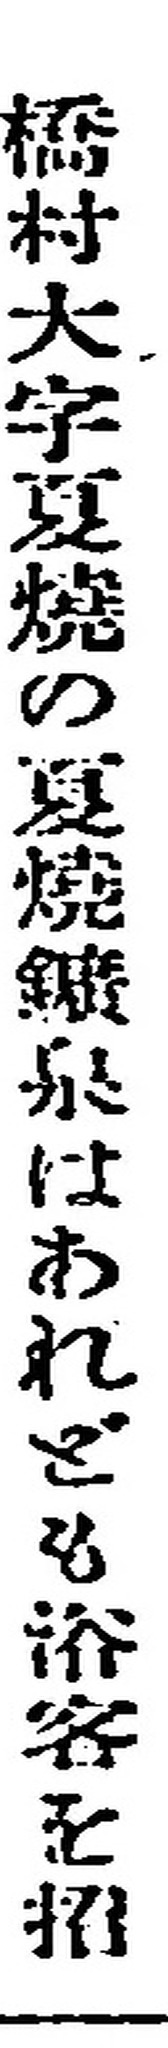橋村大字夏焼の夏焼鉱泉はあれども浴客を招
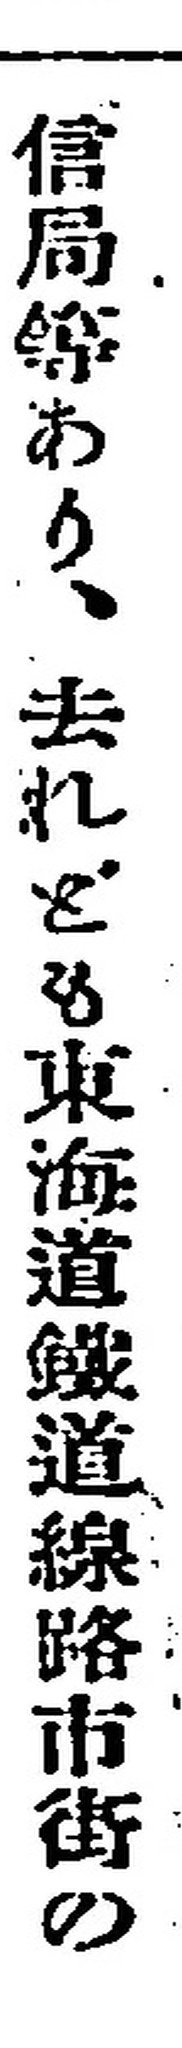信局等あり、去れども東海道鉄道線路市街の
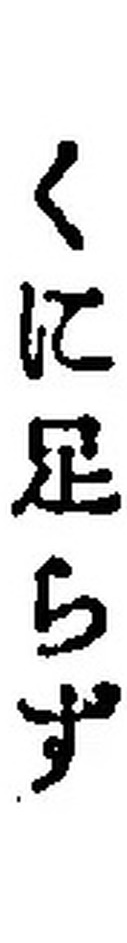くに足らず
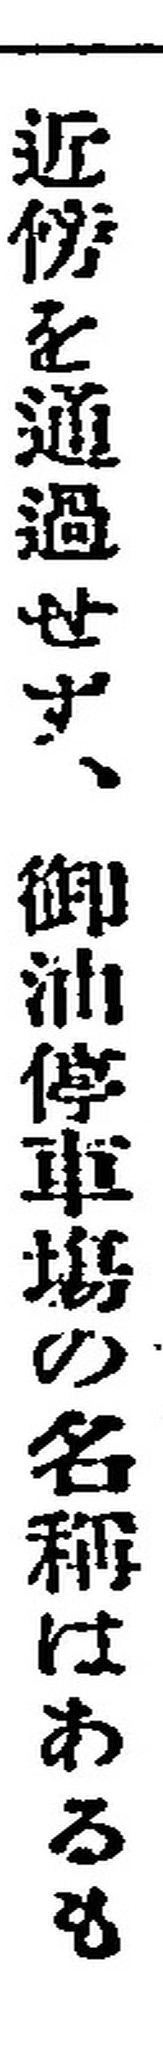近傍を通過せず、御油停車場の名称はあるも
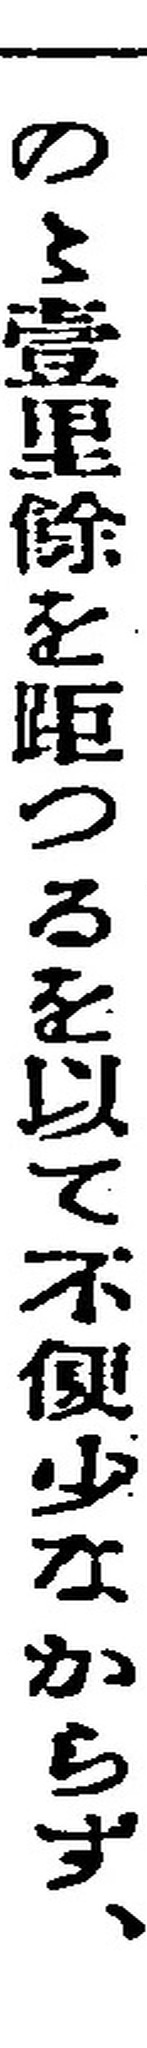のゝ壱里余を距つるを以て不便少なからず、
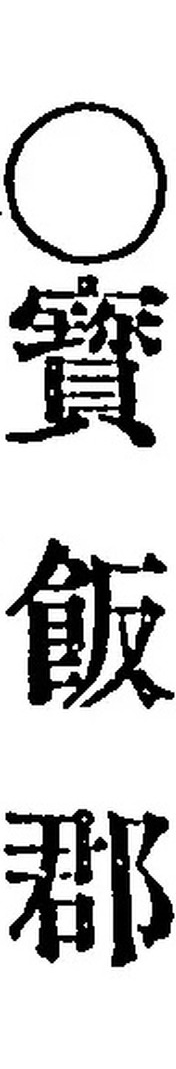○宝飯郡
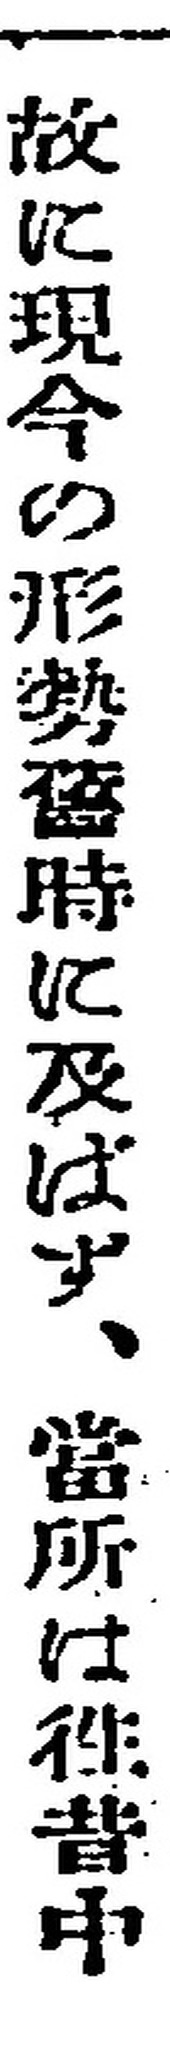故に現今の形勢旧時に及ばず、当所は往昔中
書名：東参名勝案内
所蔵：国立国会図書館 National Diet Library, JAPAN
